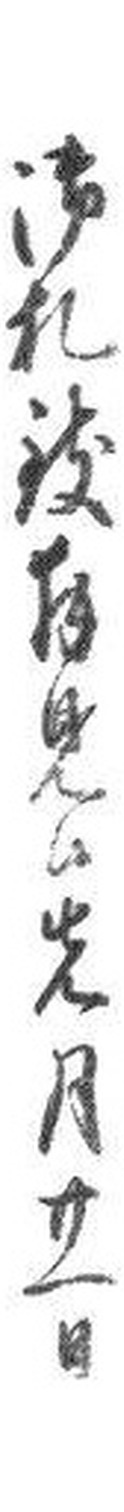御札致拝見候先月廿一日
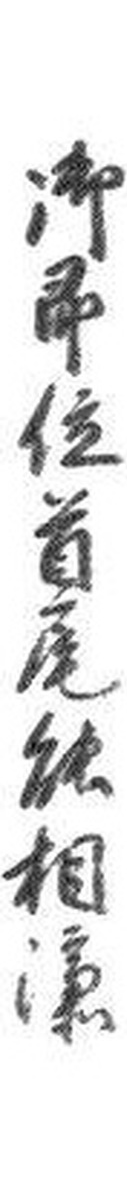御即位首尾能相済
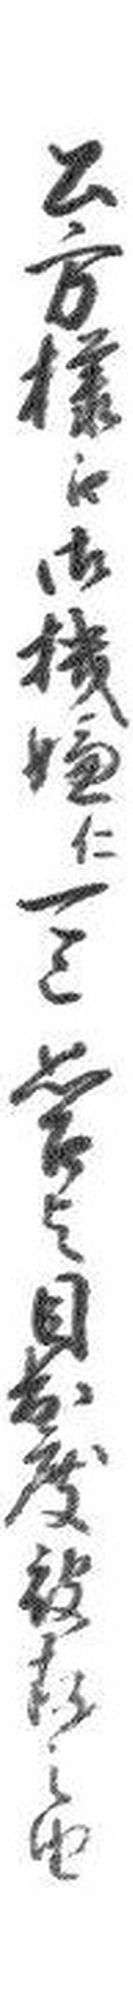公方様江御機嫌に可被思召与目出度被存之由
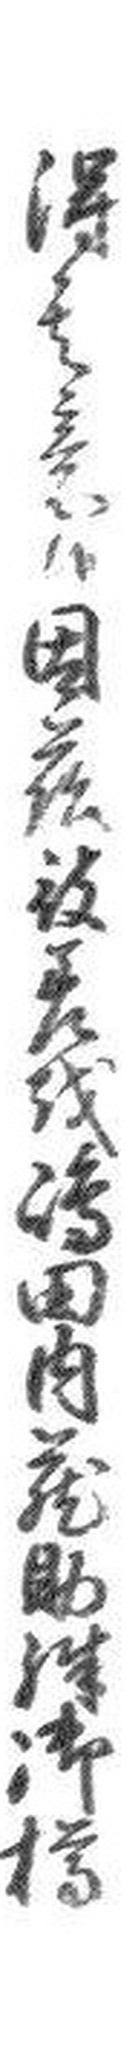得其意候因茲被差越嶋田内蔵助殊御樽
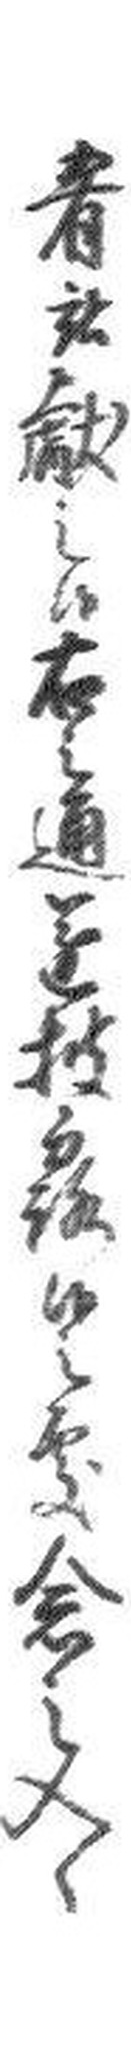肴被献之候右之通遂披露候之処念之入候
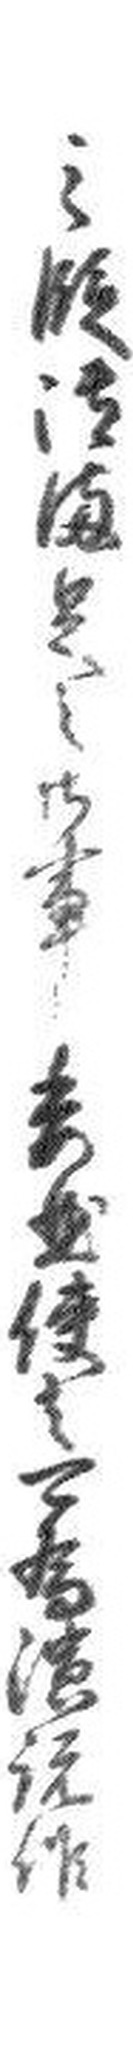之段御満足之御事委曲使者可為演説候
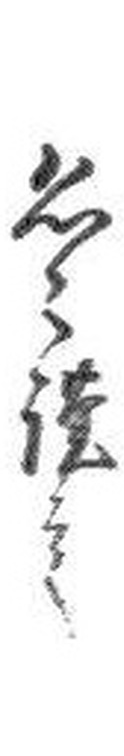恐々謹言
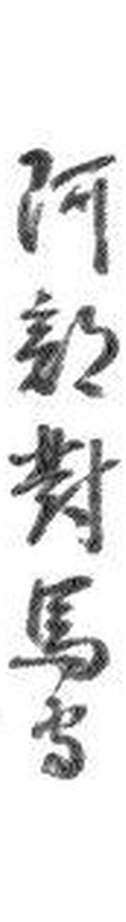阿部対馬守
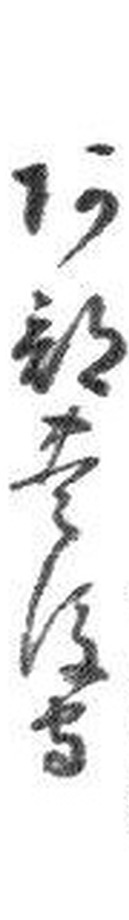阿部豊後守
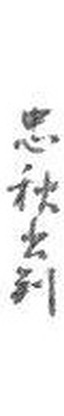忠秋書判

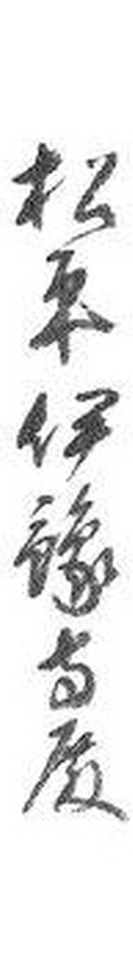松平伊予守殿
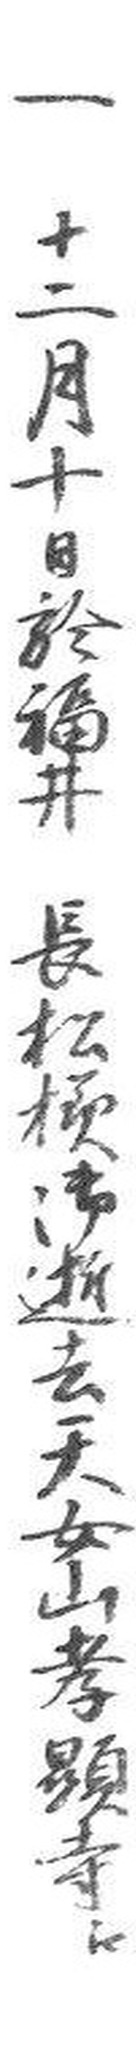一十二月十日於福井長松様御逝去天女山孝顕寺江
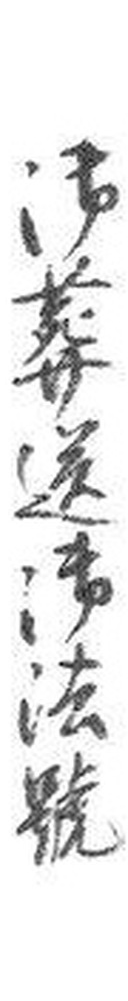御葬送御法号
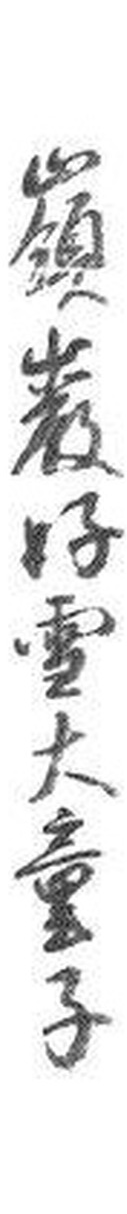嶺巌好雪大童子
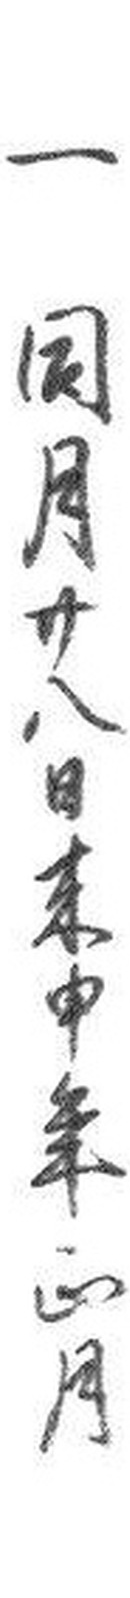一同月廿八日来申年正月
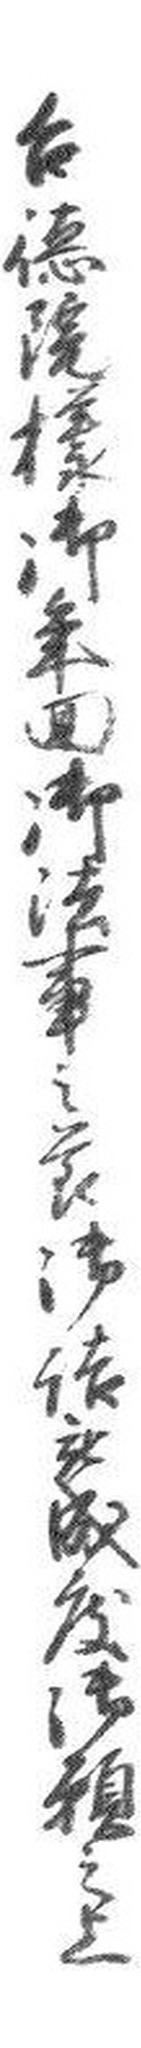台徳院様御年回御法事之節御詰被成度御願之上
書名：家譜 四 忠昌公 従寛永七年到正保四年
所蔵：福井県文書館 Fukui Prefectural Archives
